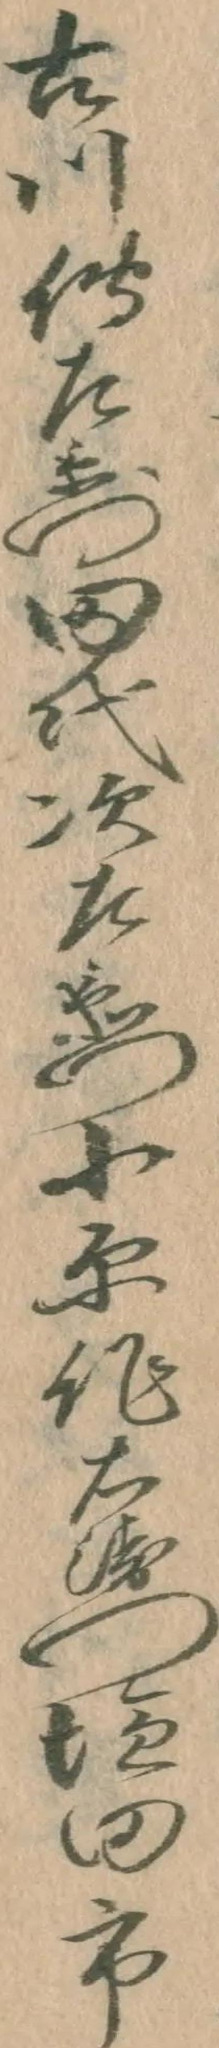古川伝左衛門田代次左衛門小原作右衛門塩田市
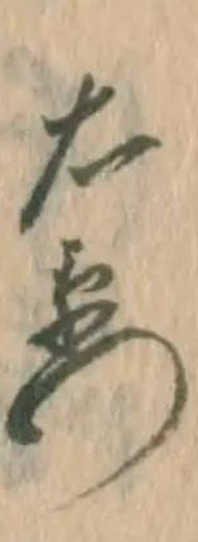右衛門
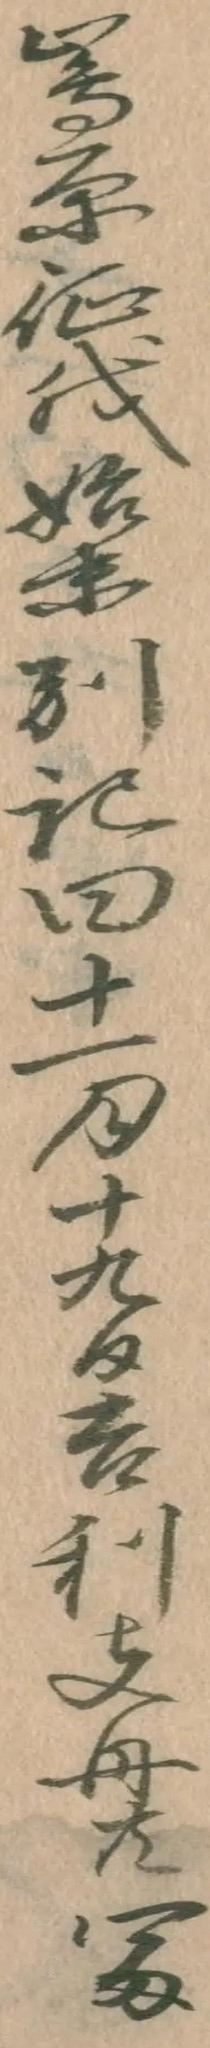島原征伐始末別記曰十一月十九日吉利支丹共富
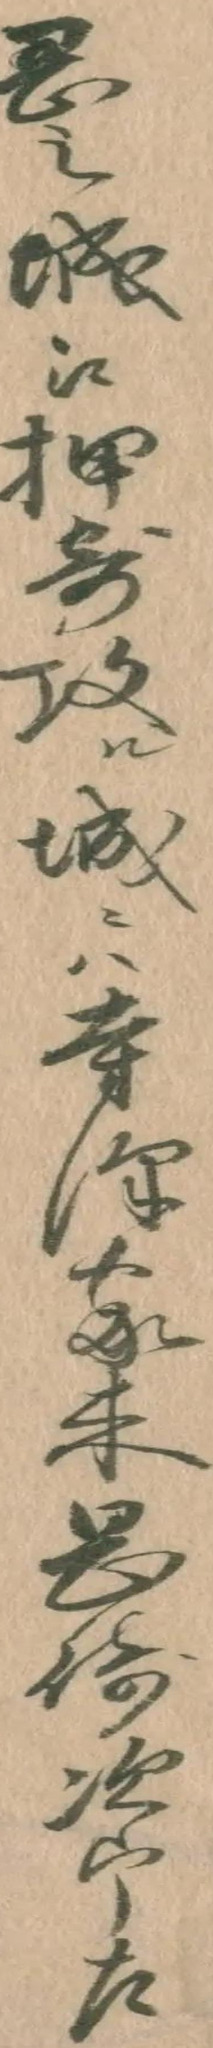岡之城江押寄攻ル城には寺沢家来岡崎次郎左
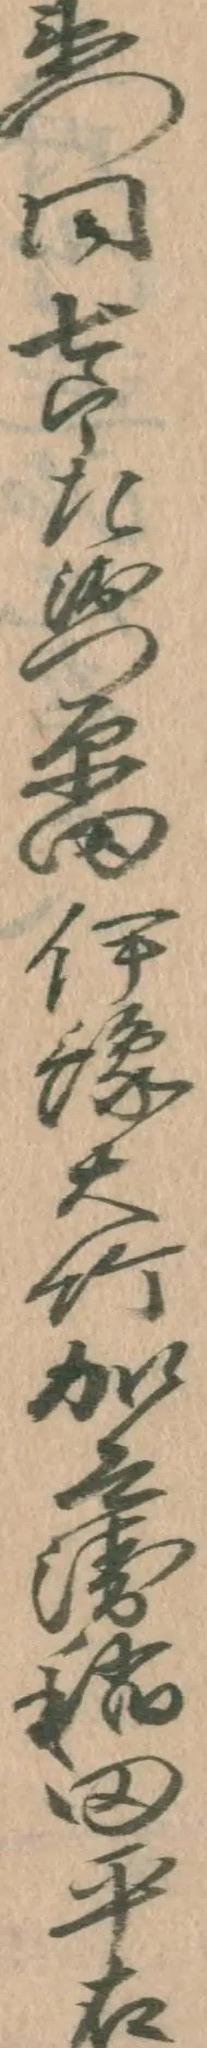衛門同七郎左衛門原田伊予大竹加兵衛稲田平右
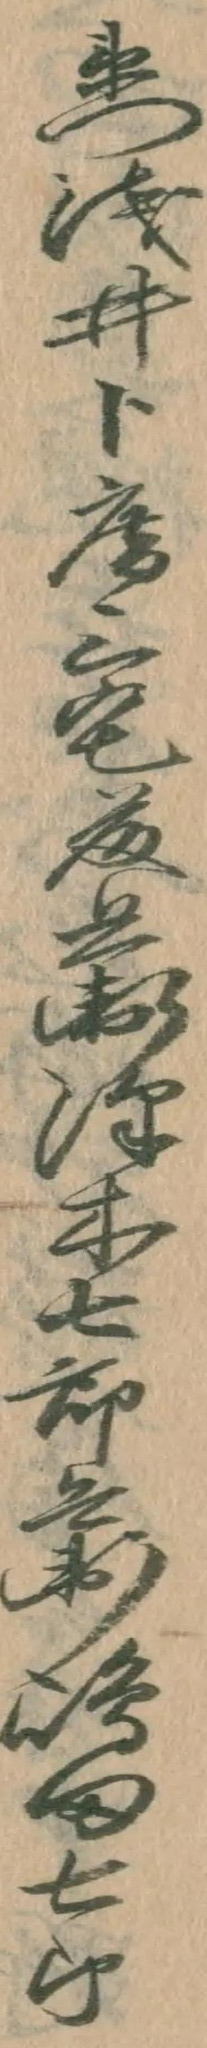衛門浅井卜庵三宅藤兵衛沢木七郎兵衛島田七郎
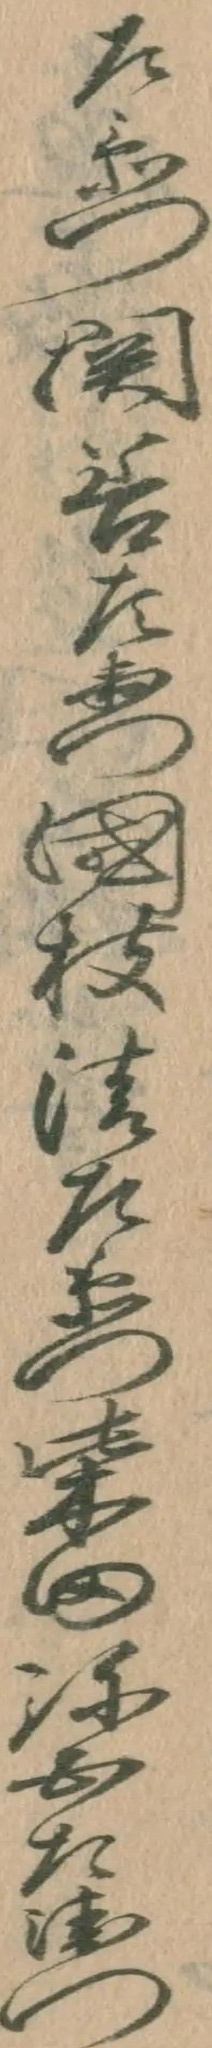左衛門関善左衛門国枝清左衛門柴田弥五左衛門
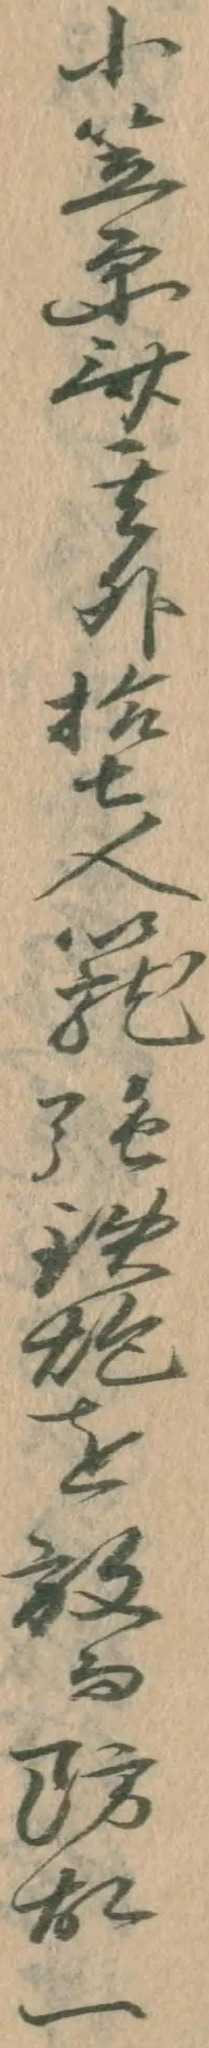小笠原斎其外拾七人籠強鉄炮を放而防故一
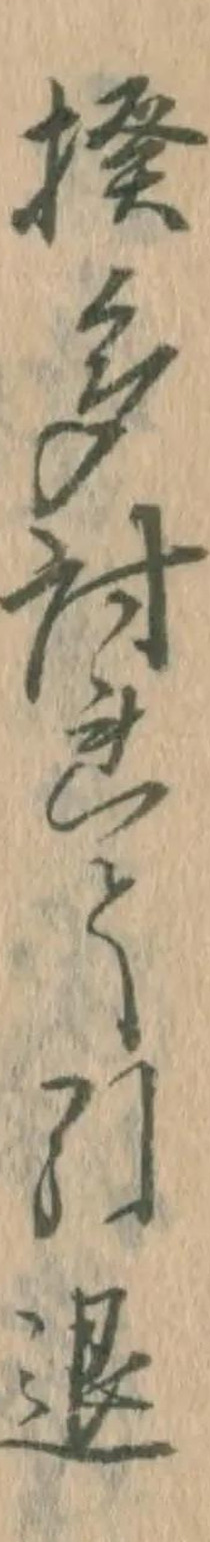揆多討れて引退
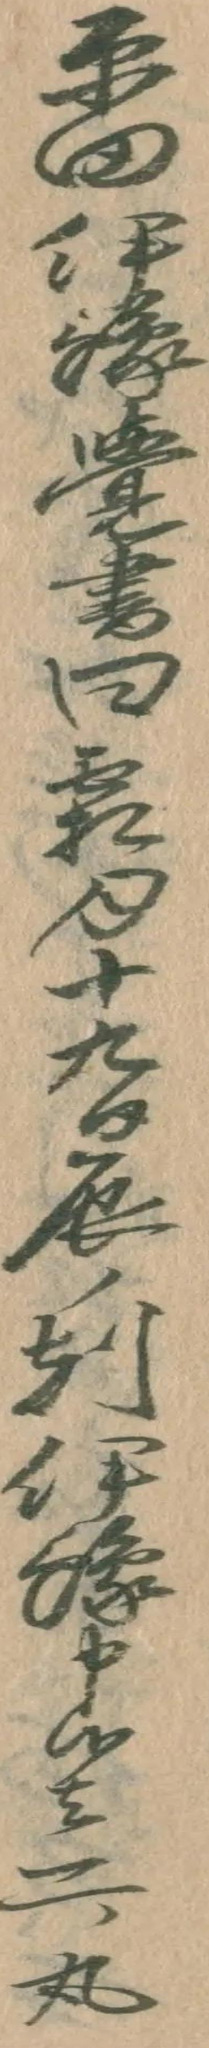原田伊予覚書曰霜月十九日辰ノ刻伊予申候は二ノ丸
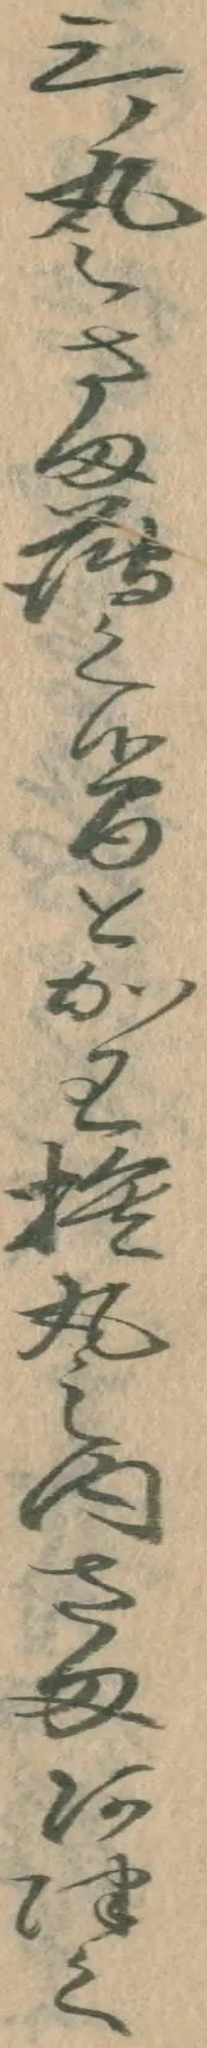三ノ丸之さま薄く候間とかわ捨丸之内さまあつく
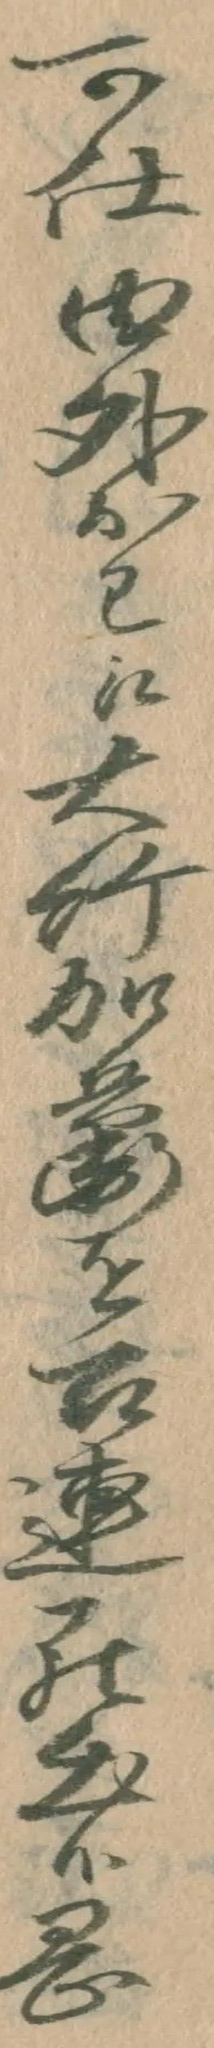可仕由外かわ江大竹加兵衛を召連罷出候岡
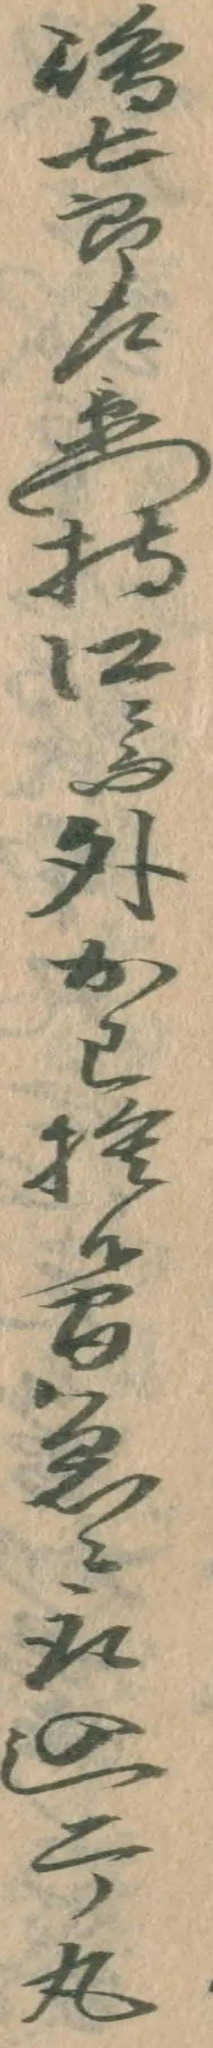崎七郎左衛門持口に而外かわ捨候間急に取込二ノ丸
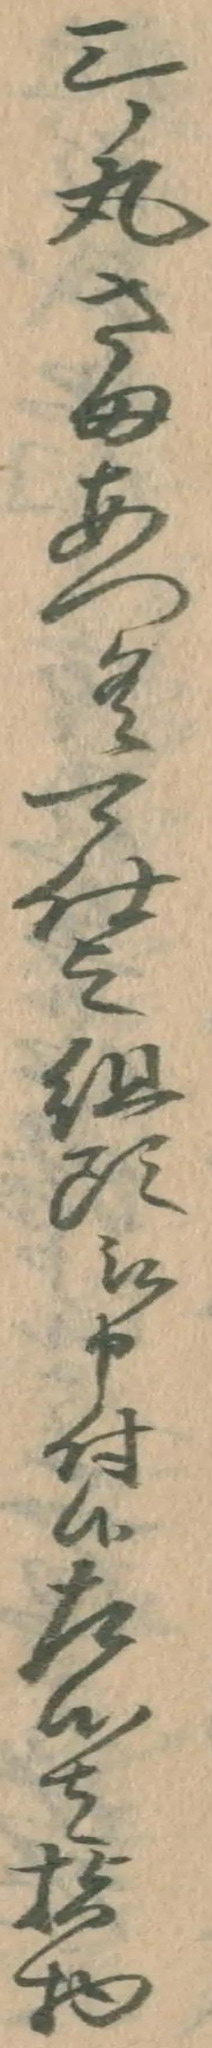三ノ丸さまあつく可仕と組頭に申付候左候は指物
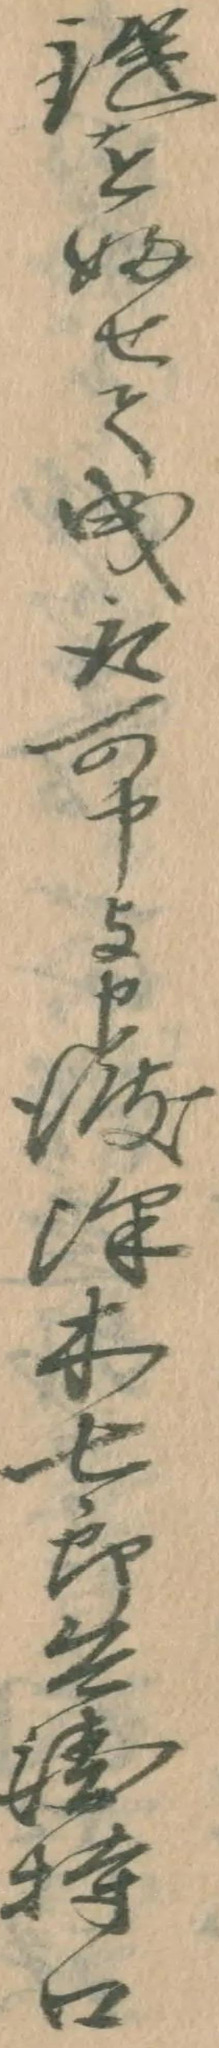鑓をふせて曳取可申と申渡沢木七郎兵衛持口

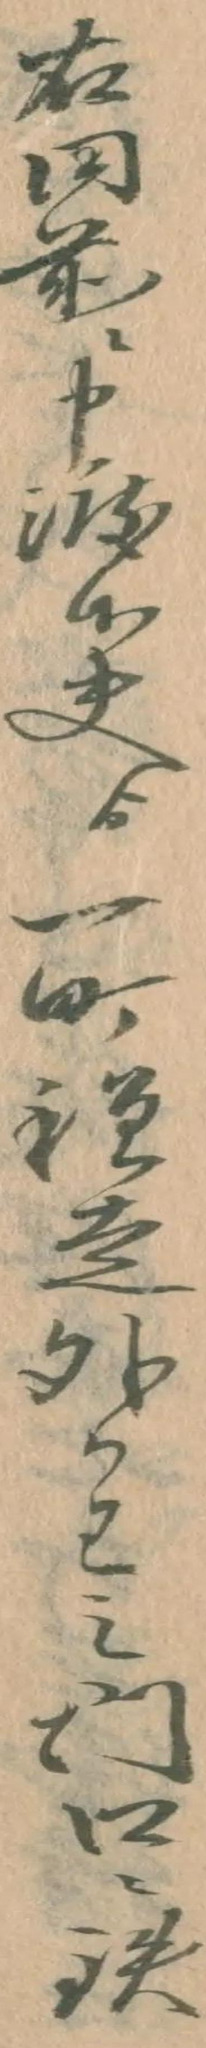右同前に申渡候夫ゟ一町程走外かわ之門口に鉄
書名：切支丹御退治記 49巻. [3]
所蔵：国立国会図書館 National Diet Library, JAPAN
